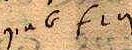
pa 6 f 19
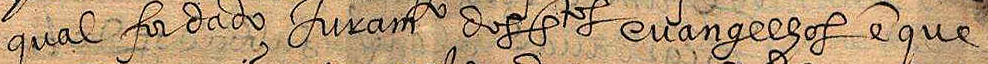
qual foi dado Juramto dos stos euangelhos ē que
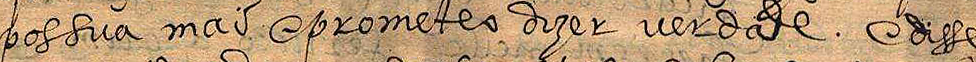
pos sua maõ e prometeo dizer uerdade. e disse
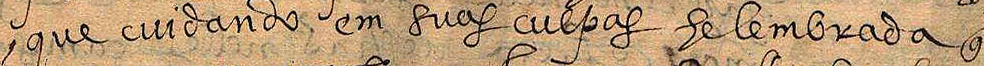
que cuidando em suas culpas he lembrada q̄
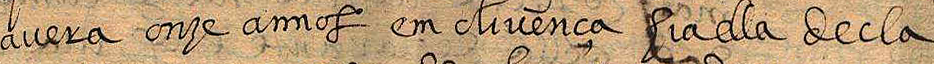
auera onze anos em oliuença hia ella decla
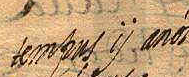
tempus ii anos
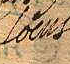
Locus
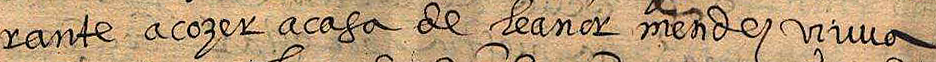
rante a cozer a casa de leanor mendez viuua
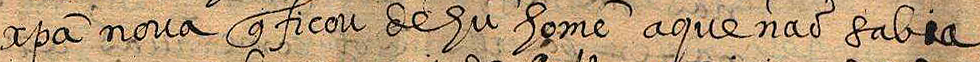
xpã noua q̄ ficou de hū homē a que naõ sabia
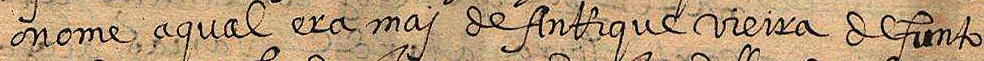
o nome a qual era maj de AnRqiue vieira defunto
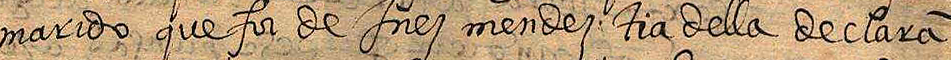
marido que foi de Jnez mendez tia della declarā
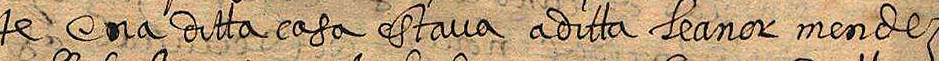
te e na ditta casa estava a ditta Leanor mendez
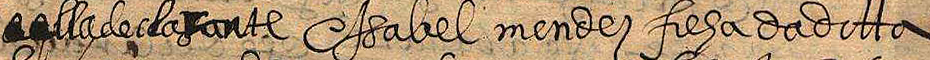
e ella declarante e Jsabel mendez filha da ditta
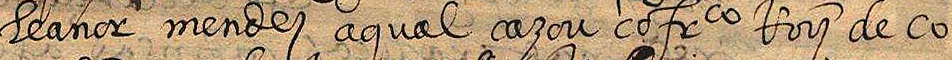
Leanor mendez a qual cazou cō frco Roiz̄ de co
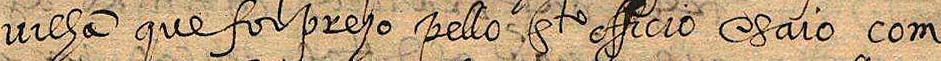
uilhã que foi prezo pelo sto officio e saio com
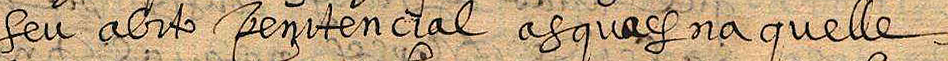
seu abito penitencial as quaes naquelle
